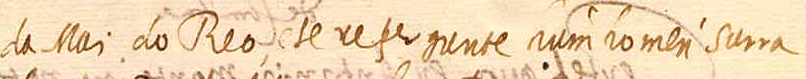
da Mai do Reo, se repergunte hum homen surra
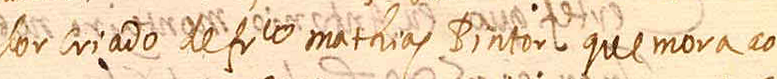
dor criado de frco mathias Pintor que mora ao
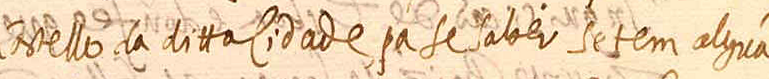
Castello da ditta Cidade, pa se saber se tem alguā
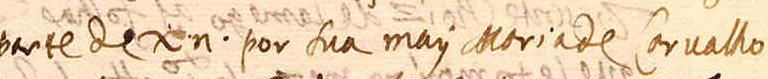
parte de x. n. por sua may Maria de Carualho
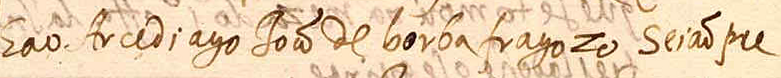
E ao Arcediago Ioão de borba fragozo seiaõ pre
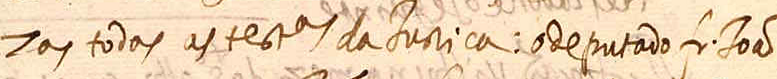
zas todas as testas da Iustica: o deputado fr. Ioāo
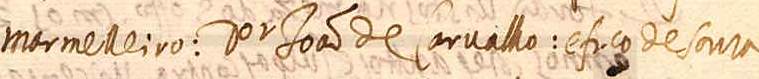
marmeleiro: Dor Ioão de Carualho: e frco de souza
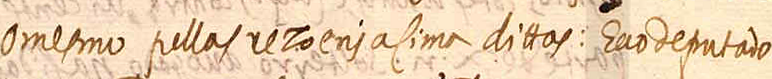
o mesmo pellas rezoens aCima dittas: E ao deputado
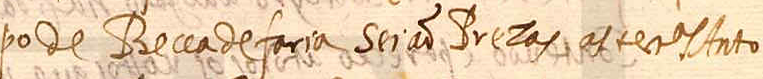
po de Becca de faria seião Prezas as testas Anto
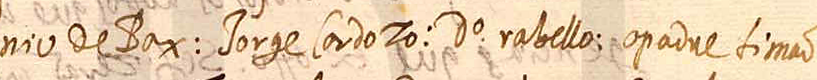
nio de Pax: Iorge Cardozo: dDo. rabello: o padre simaõ
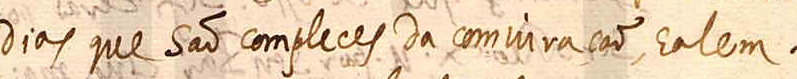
dias que são compleces da comiuraçaõ, E alem
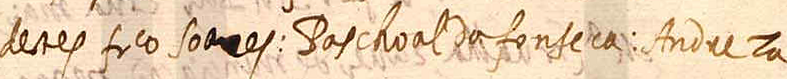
destes frco soares: Paschoal da fonseca: Andreza
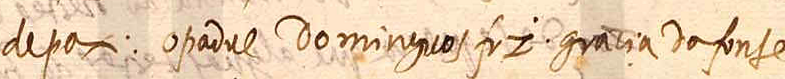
de pax: o padre Dominguos frz̄ gracia da fonse
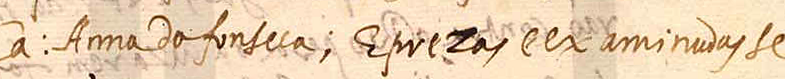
Ca: Anna da fonseca; E prezas e examinadas se
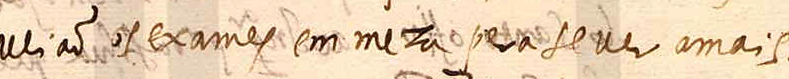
ueiaõ os exames em meza pera se uer a mais
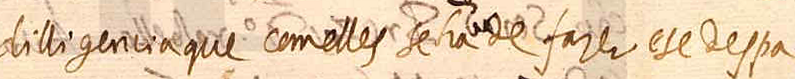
dilligencia que com elles se ha de fazer e se despa
